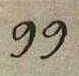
99
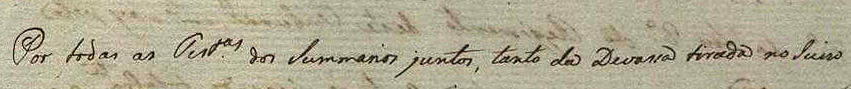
Por todas as Test.as dos Summarios juntos, tanto da Devassa tirada no Iuizo
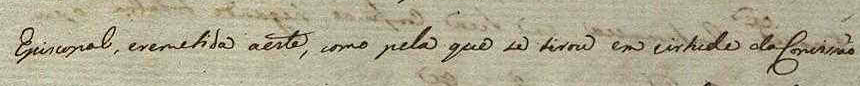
Episcopal, e remetida a este, como pela que se tirou em virtude da Comissão
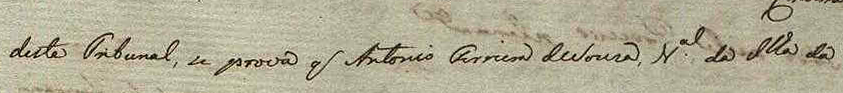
deste Tribunal, se prova q̄ Antonio Ferrem de Souza, N.al da Ilha da
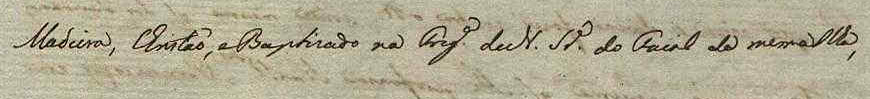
Madeira, Chistaõ, e Baptizado na Frega.de N. Sr.a do Faial da mesma Ilha,
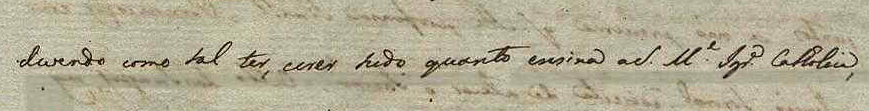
devendo como tal ter, e crer tudo quanto ensina a S. M.e Igr.a Catholica,
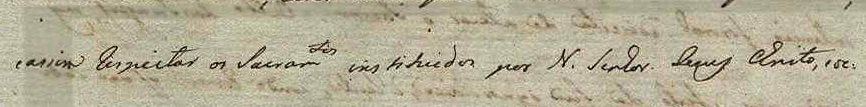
e assim Respeitar os Sacram.tos instituidos por N. Senhor Iezus Christo, e ve
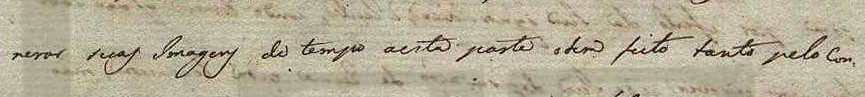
nerar suas Imagens de tempo a esta parte o tem feito tanto pelo Con
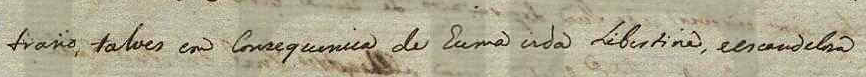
trario, talves em Consequencia de huma vida Libertina, e escandelosa
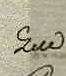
Que
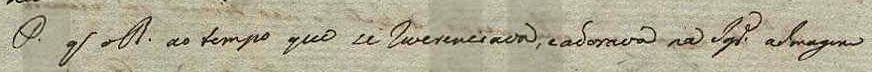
P. q̄ o R. ao tempo que se Reverenciava, e adorava na Igr.a a Imagem
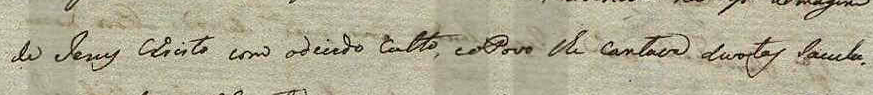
de Iezus Christo com o devido culto, e o Povo lhe cantava devotas Iacula
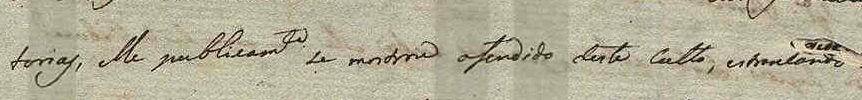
torias, elle publicam.te se mostrou ofendido deste Culto, estranhando
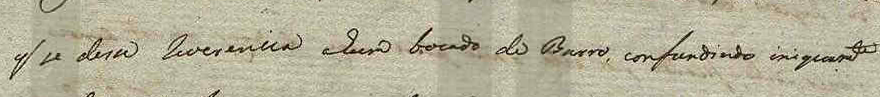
q̄ se desse Reverencia, a hum bocado de Barro, confundindo iniquam.te
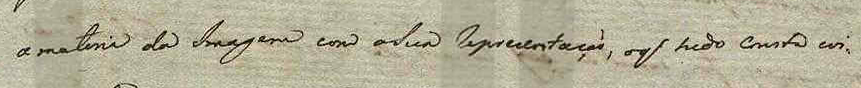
a materia da Imagem com a Sua Reprezentaçaõ, o q̄ tudo consta evi
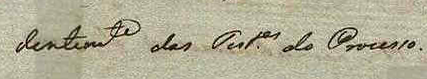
dentem.te das Test.as do Processo.
